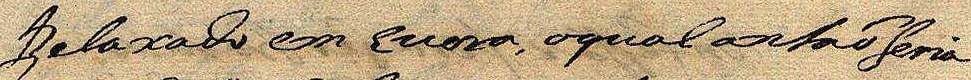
Relaxado em Euora, o qual antaõ seria
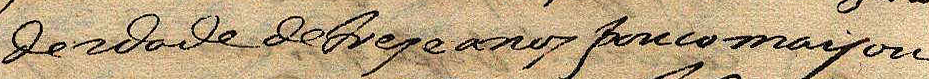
de idade de treze anos pouco mais ou
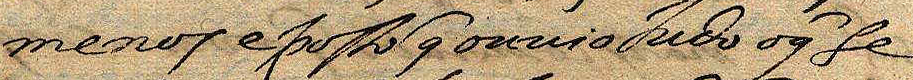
menos e posto q̄ ouuio tudo o q̄ se
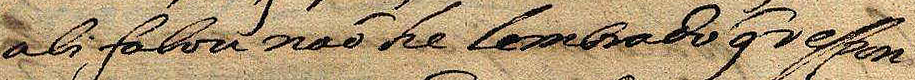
ali falou naõ he lembrado q̄ respon
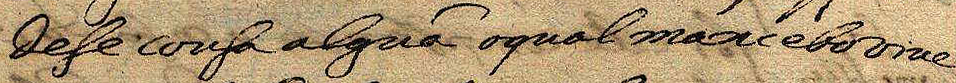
dese cousa alguā o qual mancebo viue
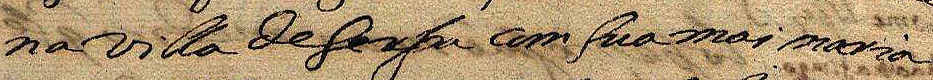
na villa de serpa com sua mai maria
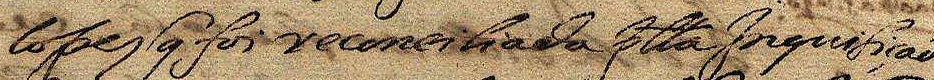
lopez q̄ foi reconciliada p̄l̄la Jnquisiçaõ
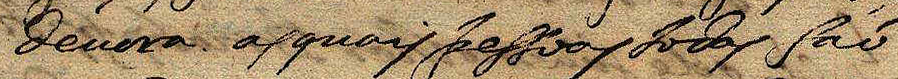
deuora as quais pessoas todas saõ
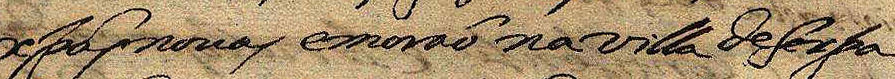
xpas̄ nouas e moraõ na villa de serpa
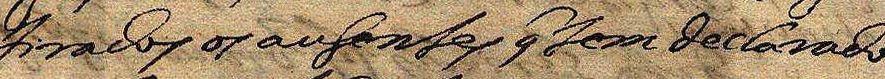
tirados os ausentes q̄ tem declarado
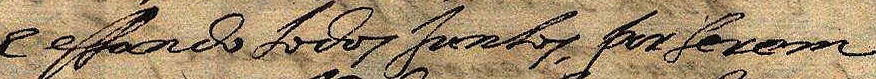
E estando todos Juntos, por serem
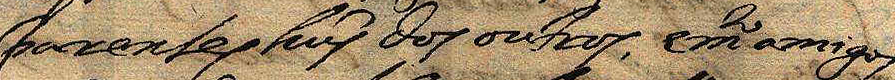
parentes hus̄ dos outros, e mto amigos
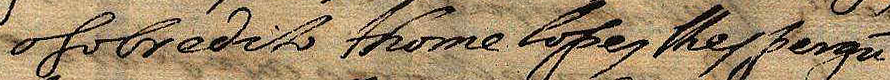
o sobredito thome lopez lhes pergū
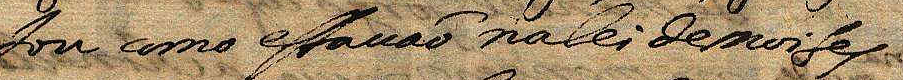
tou como estauaõ na lei de moises
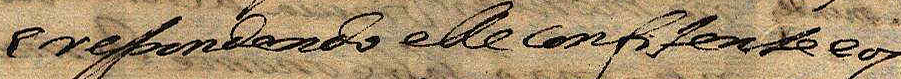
E respondendo elle confitente e os
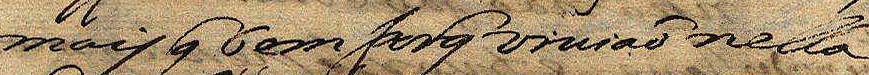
mais q bem porq̄ viuiaõ nella
